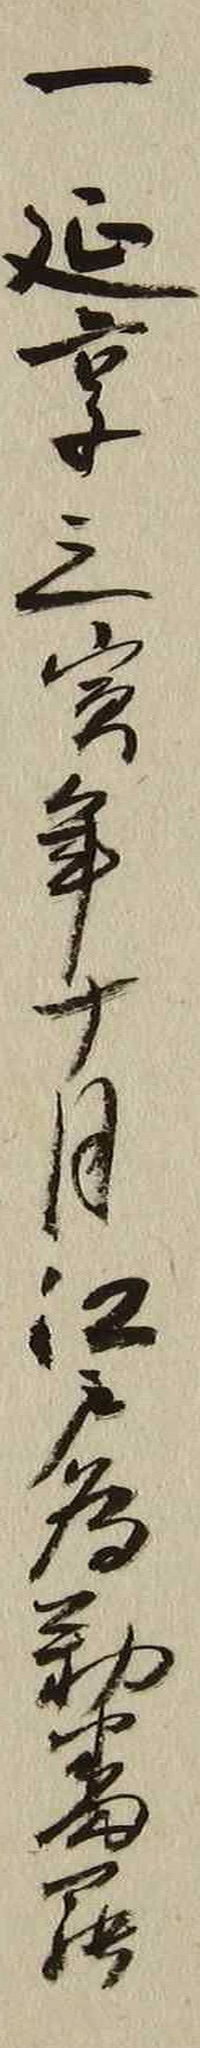一延享三寅年十月江戸為勤番罷
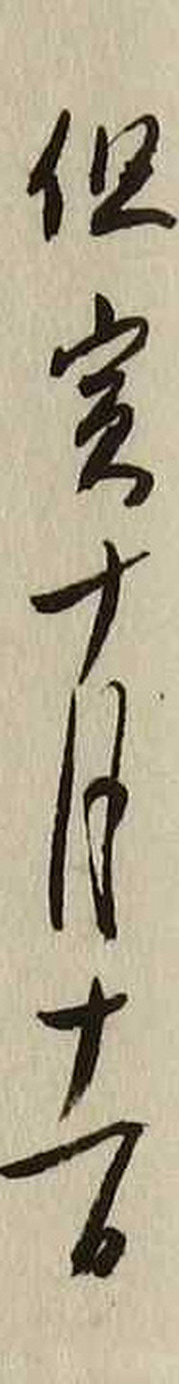但寅十月十一日
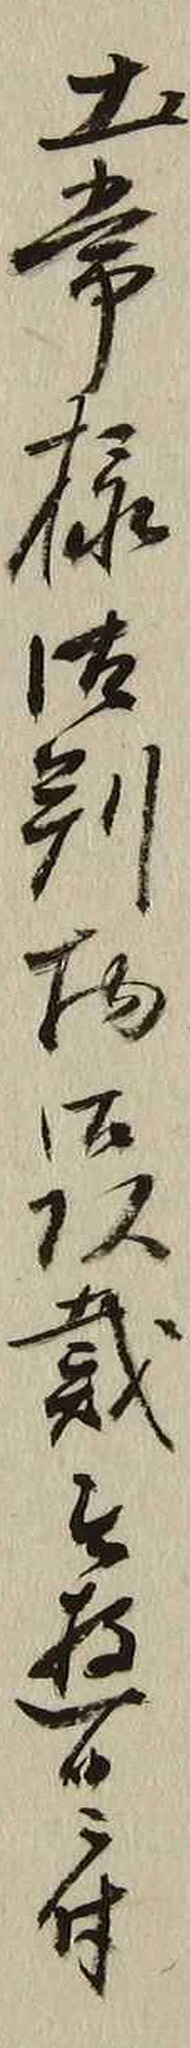土常様御判物御頂戴被遊候ニ付
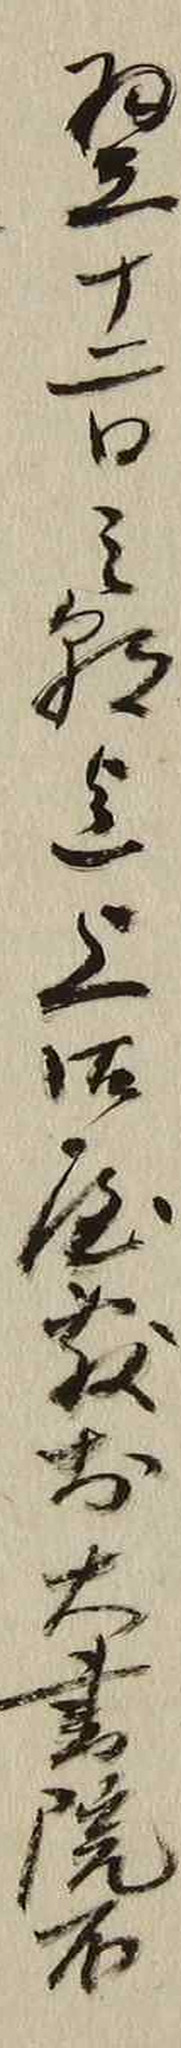翌十二日之朝迄上御屋敷於大書院不
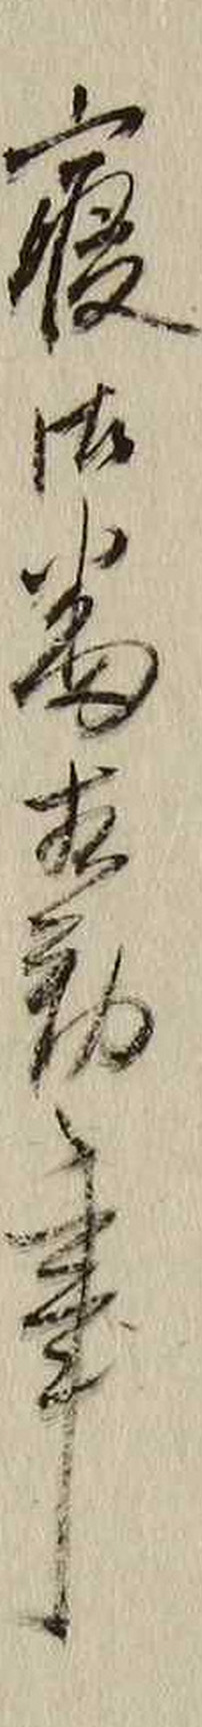寝御番相勤候事
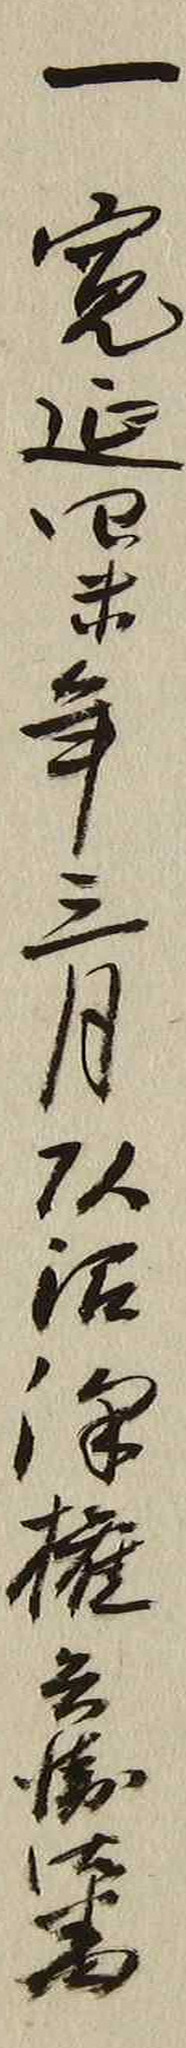一寛延四未年三月頭沼沢権兵衛御番
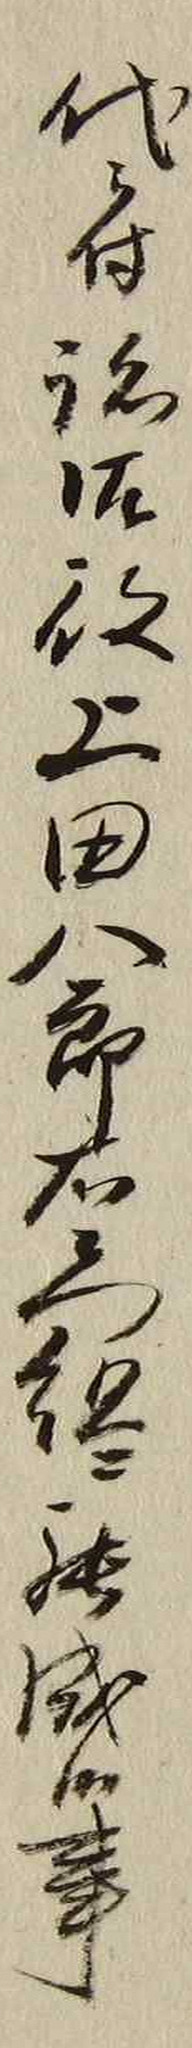代ニ付跡御役上田八郎右衛門組ニ罷成候事
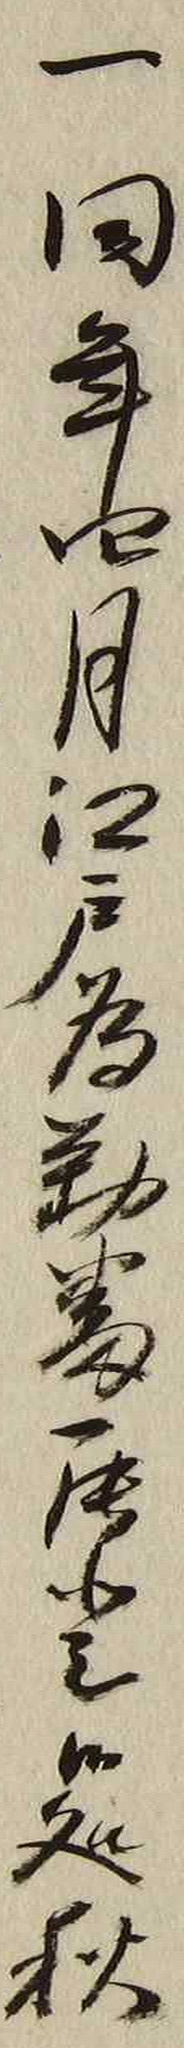一同年四月江戸為勤番罷登候処秋
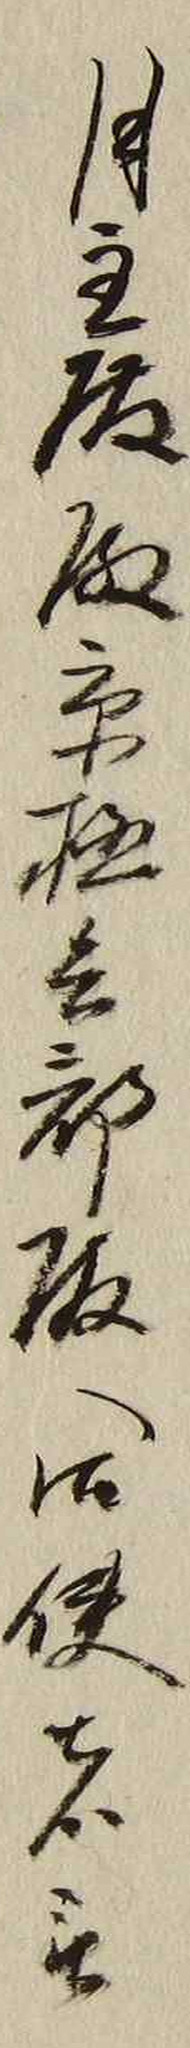月主殿殿京極兵部殿へ御使者被
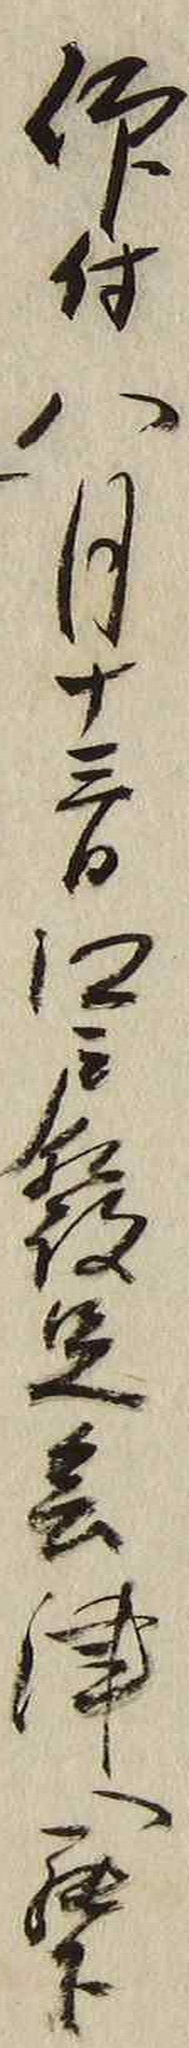仰付八月十三日江戸発足会津へ罷下

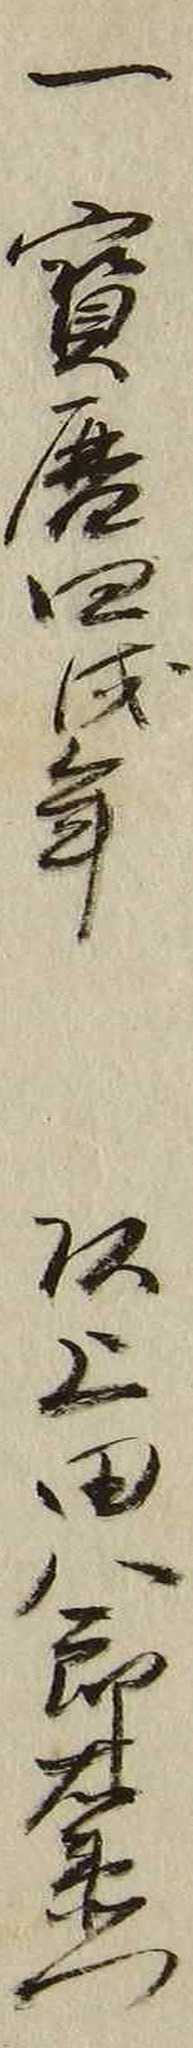一宝暦四戌年頭上田八郎右衛門
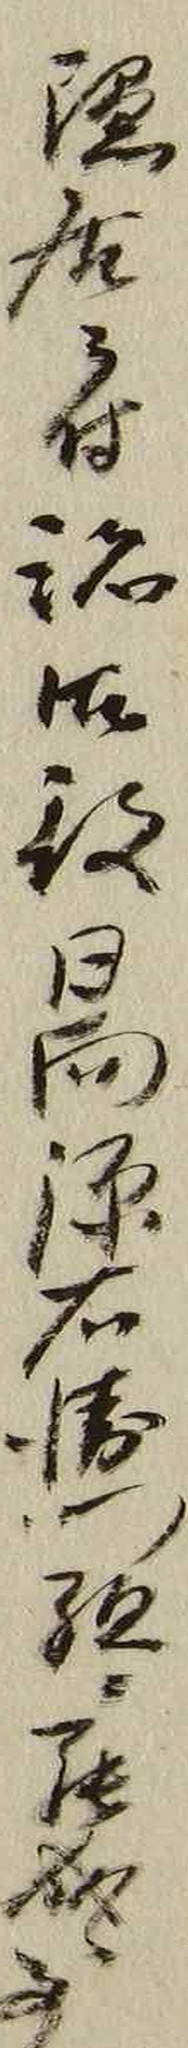隠居ニ付跡御役日向源右衛門組ニ罷成候事
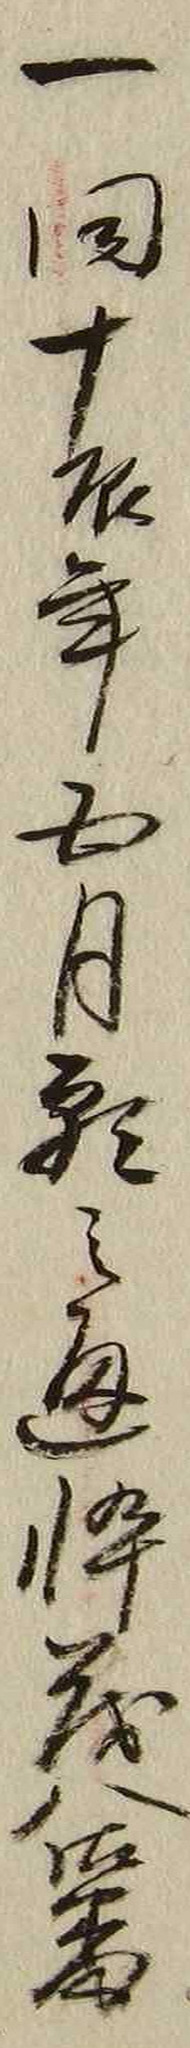一同十辰年五月願之通忰茂八御番
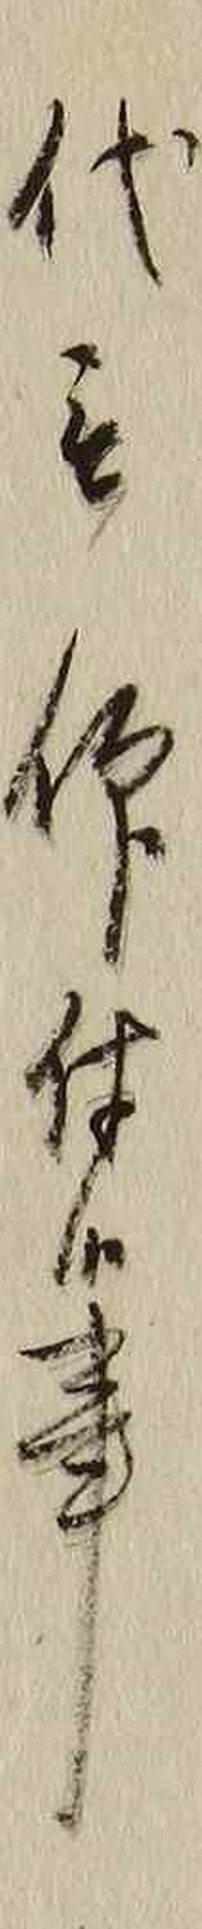代被仰付候事
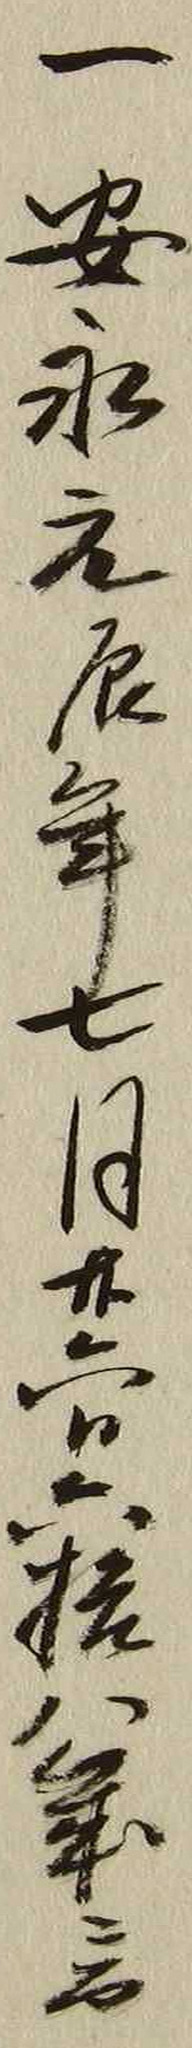一安永元辰年七月廿六日六拾八歳ニ而
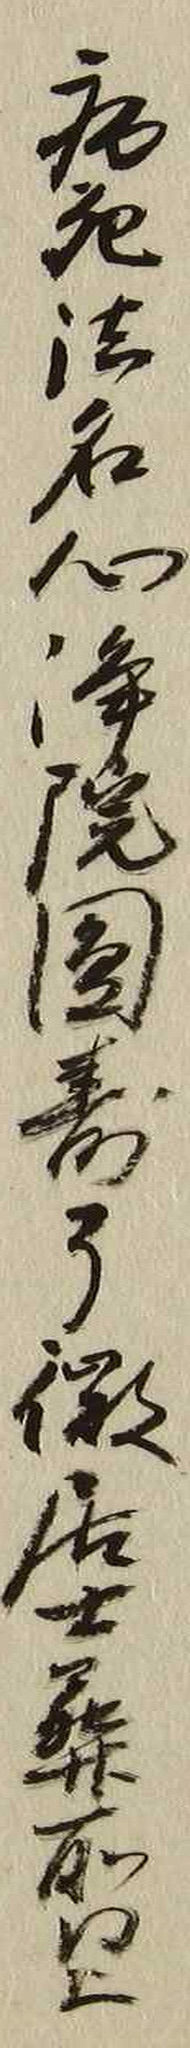病死法名心浄院円寿了微居士葬所同上
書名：諸士系譜　巻之346　も之部2
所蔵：会津若松市立会津図書館
